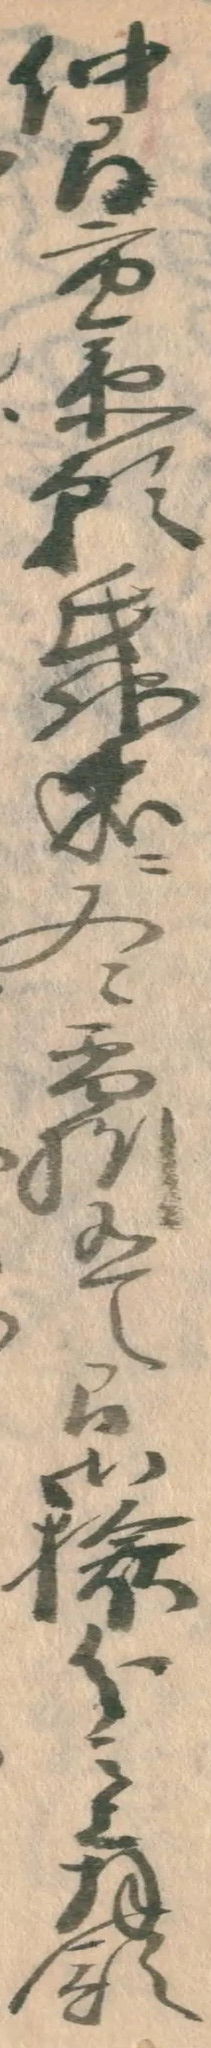一仲間市兵衛願氏神森ニ又々雪折有之間御検分之上拝領
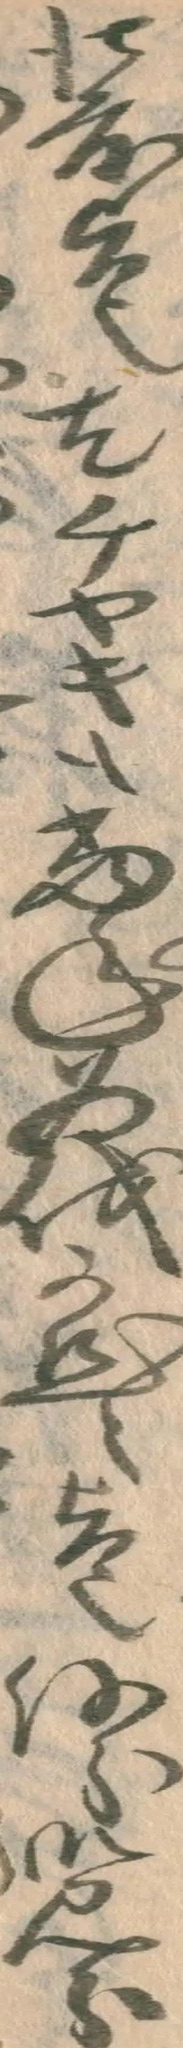仕度旨也尤ケヤキも当年為伐可然之旨也何分御見分
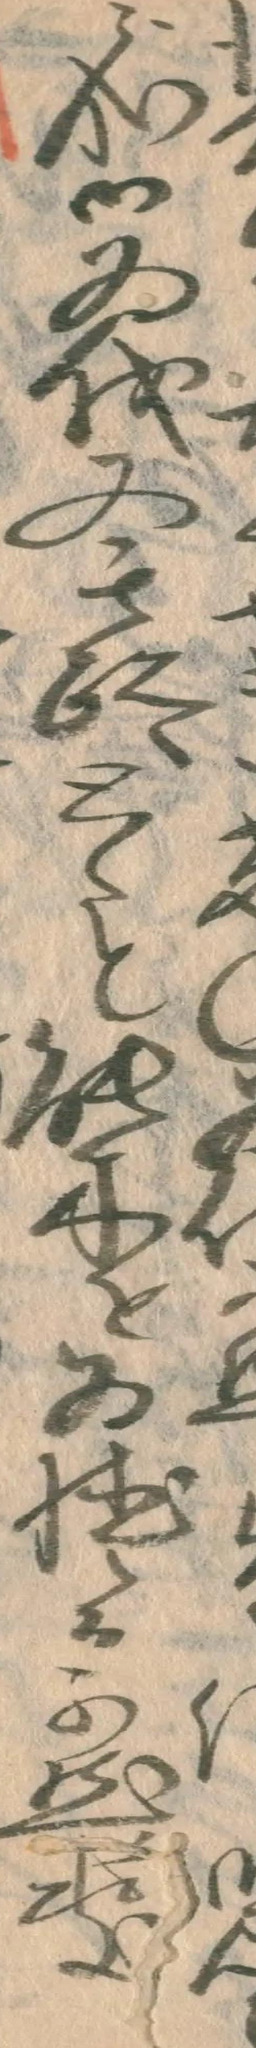被成御為伐又其跡へとくと能木を為植候而可然ニ決
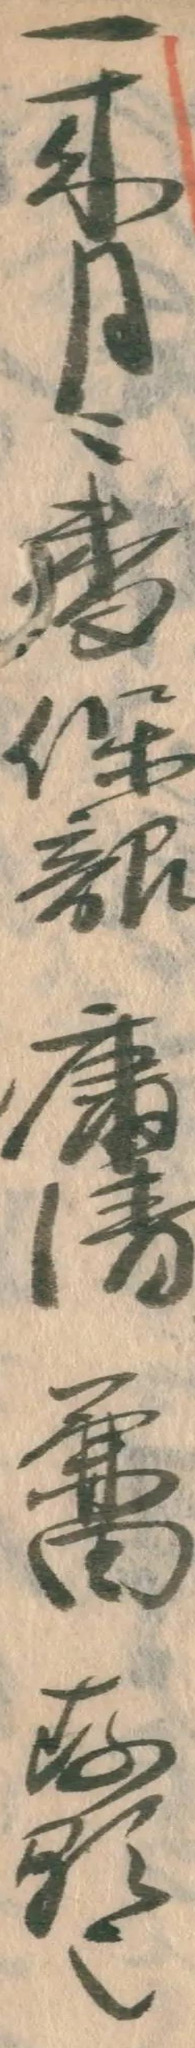一来月々番保韶庸清兼田存顕也
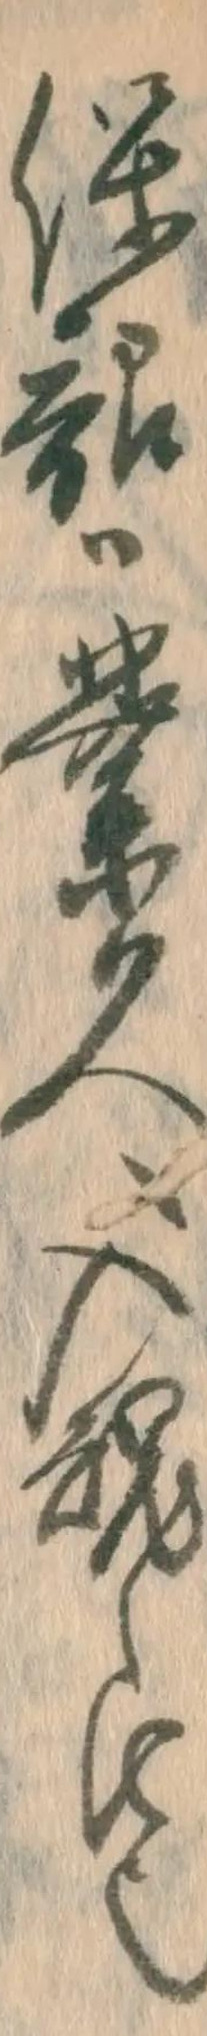保韶ハ業久ニ入魂之由也
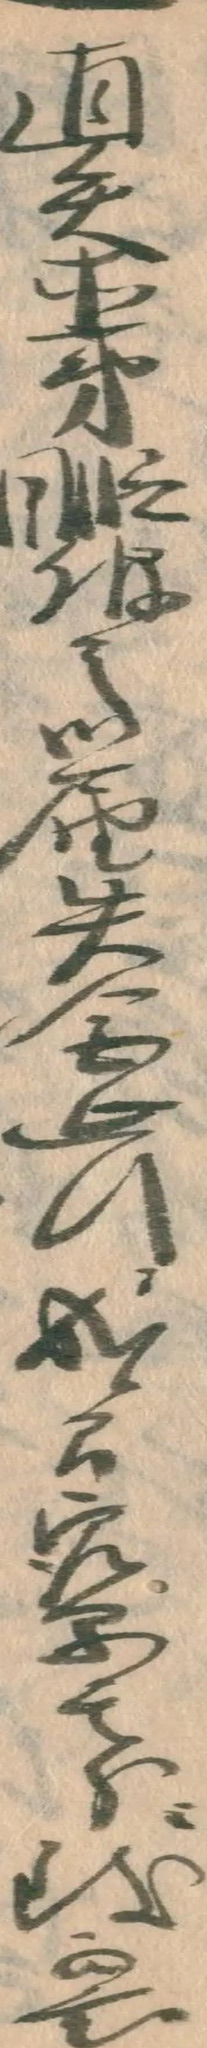一直矢直第暇服之御届失念延引ニ成候間最早其分ニ致可置
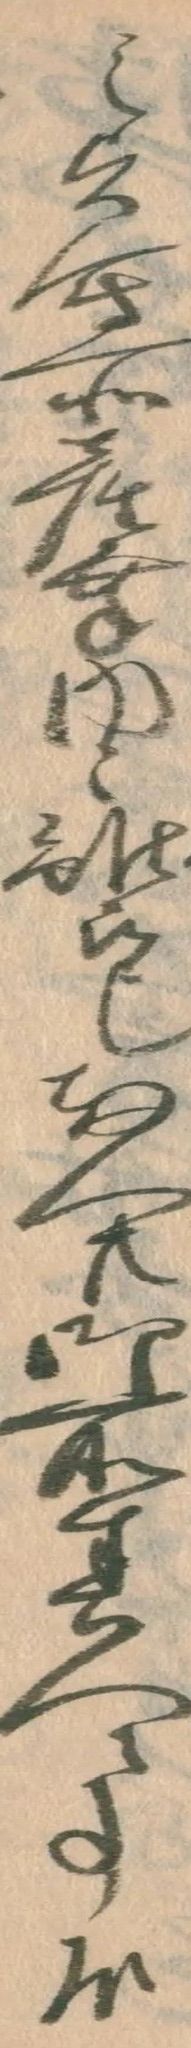之旨会所産幸内々雖被申候両人共御所奉公人之事故
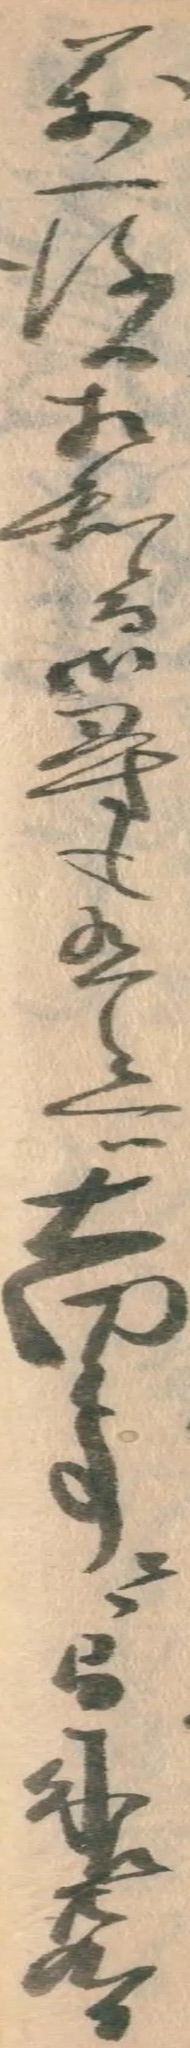万一後日相知候而御尋も有之候ヘハ大切事ニ候間来ル廿九日
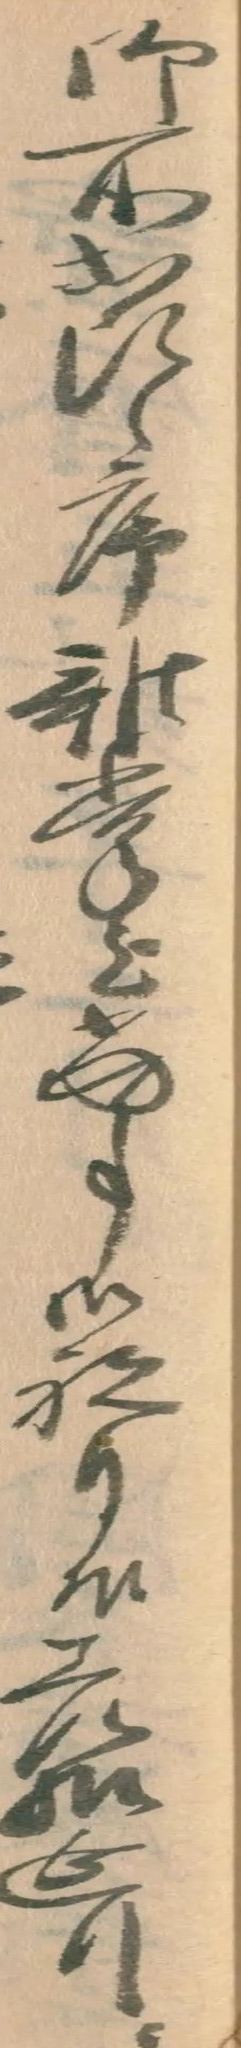御所出頭之序雑掌迄当月御祝月故差扣延引ニ
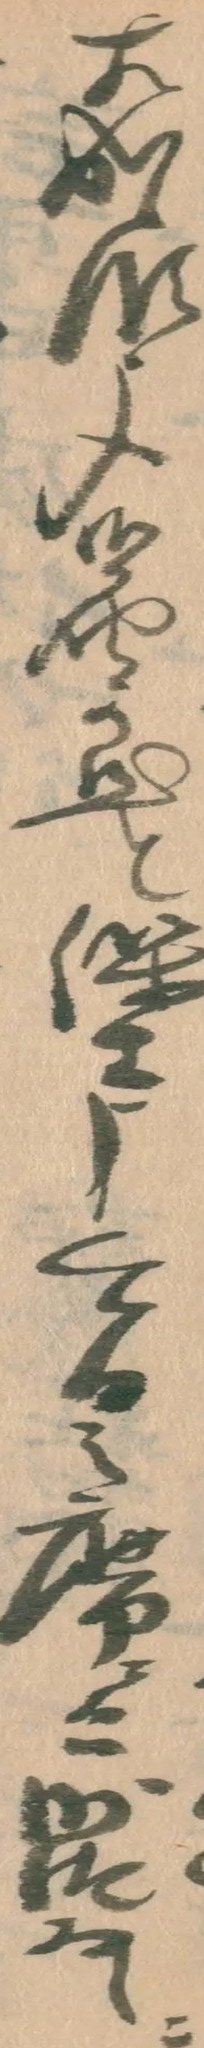相成候段申入御届可然と保土申今日之席ニ而ハ沙汰に
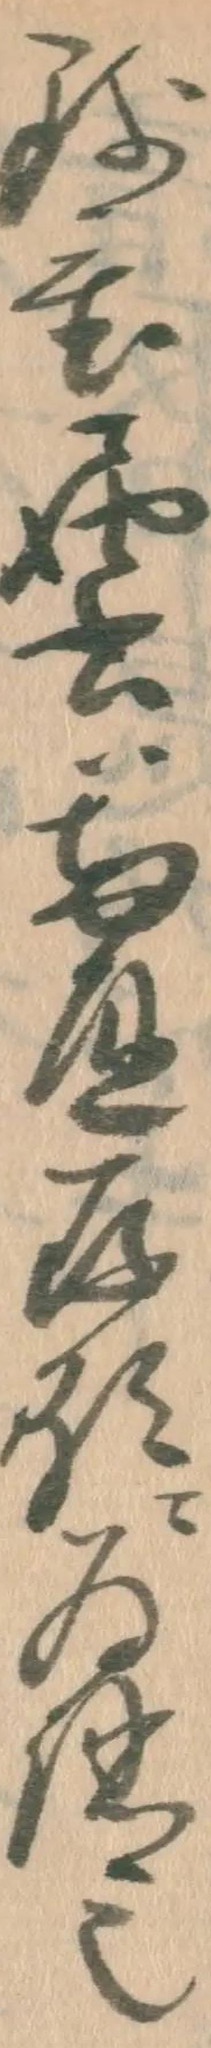致置届書ハ両通存顕ニ為認也
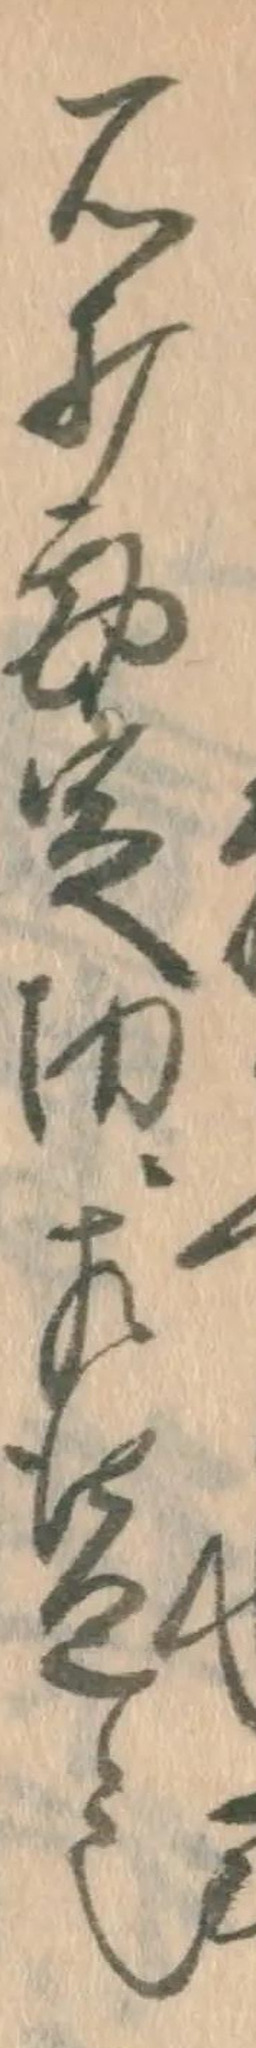石打勘定切ニ相仕廻候也
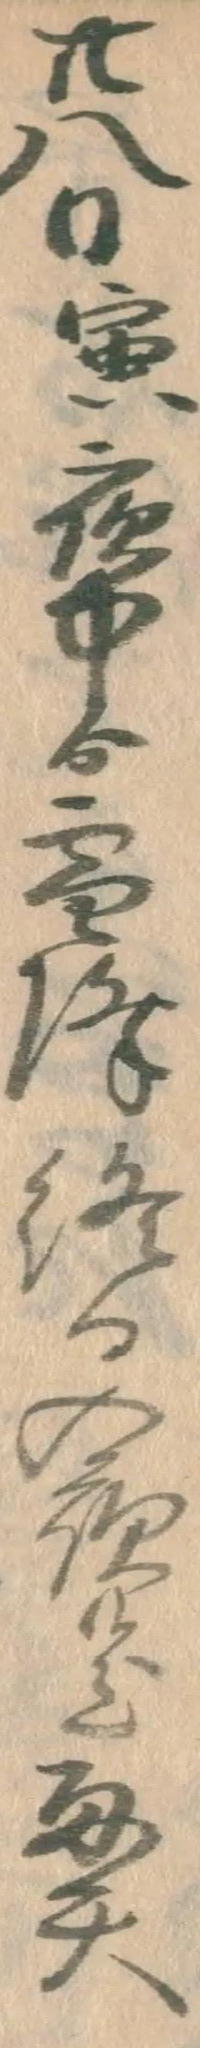廿八日寅夜中ゟ雪降終日入夜候迄雨天
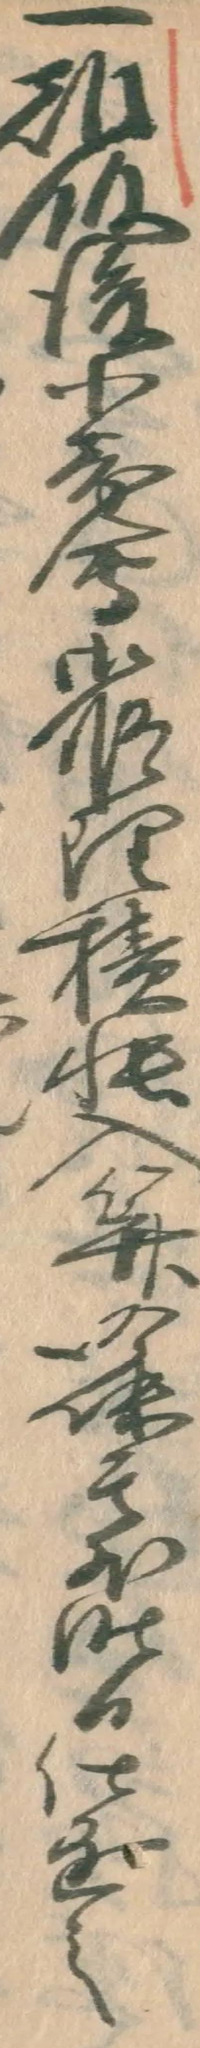一朝飯後小寄会御修理積帳入算吟味其外昨日仕懸之
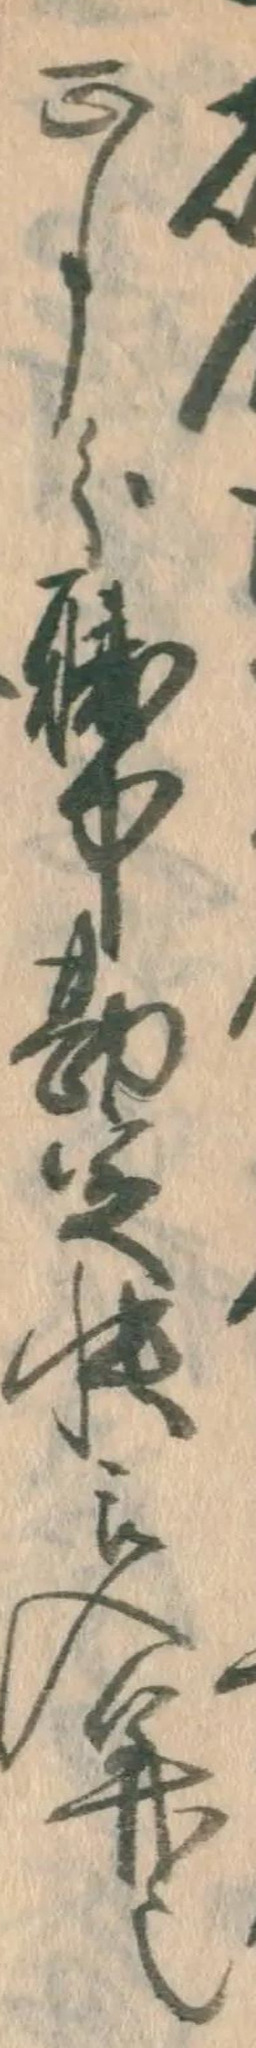正月分職中勘定帳被入算也
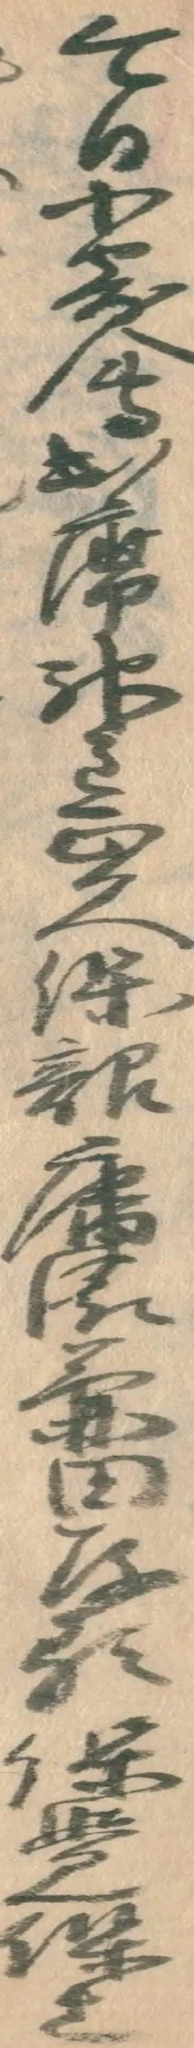今日小寄会出席神主正久保韶庸清兼田存顕保覚保土
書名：賀茂社記録. 第60冊
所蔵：国立国会図書館 National Diet Library, JAPAN
